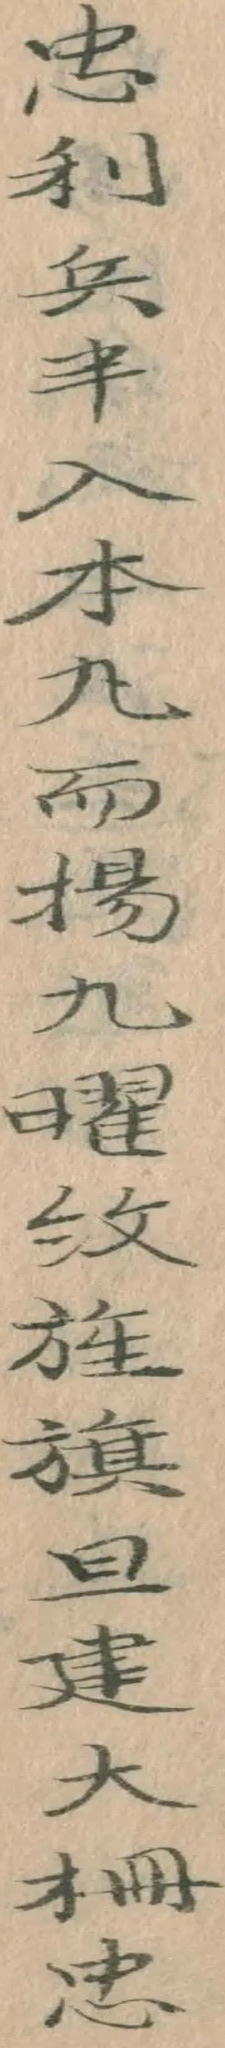忠利兵半入本丸而揚九曜紋旌旗旦建大柵忠
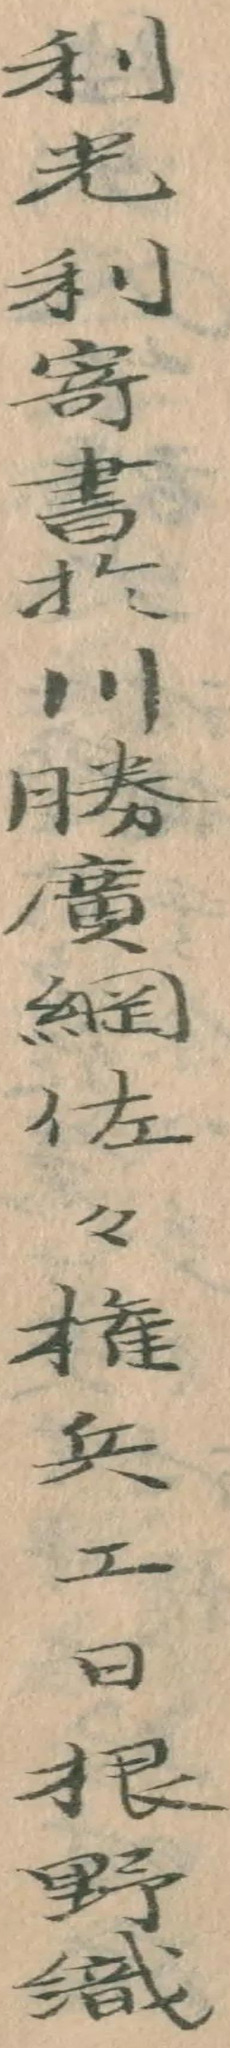利光利寄書於川勝広綱佐々権兵衛日根野織
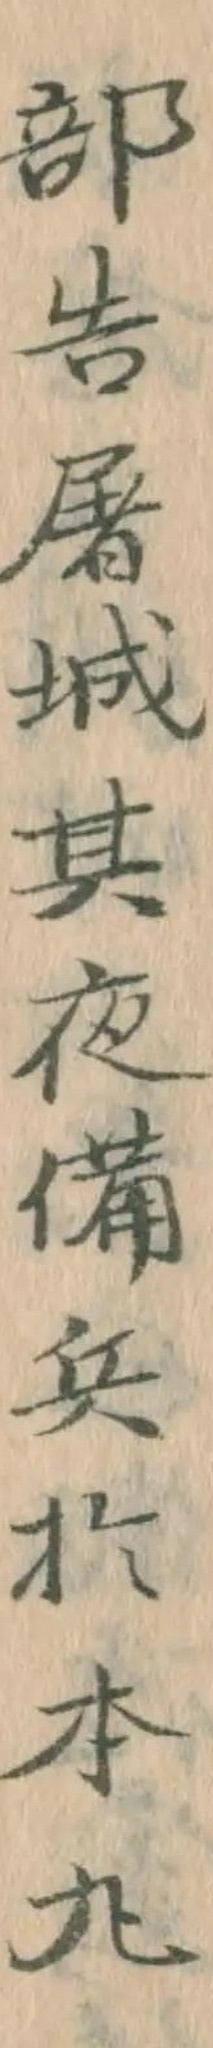部告屠城其夜備兵於本丸
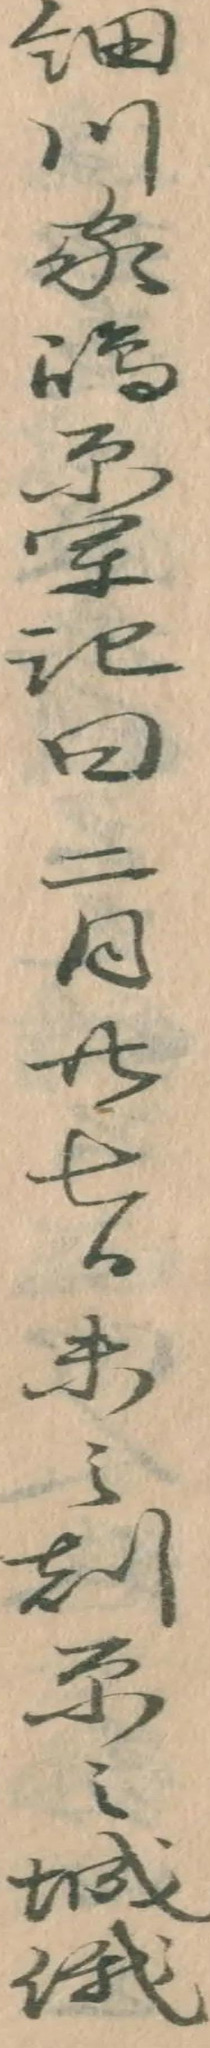細川家島原軍記曰二月廿七日未之刻原之城俄

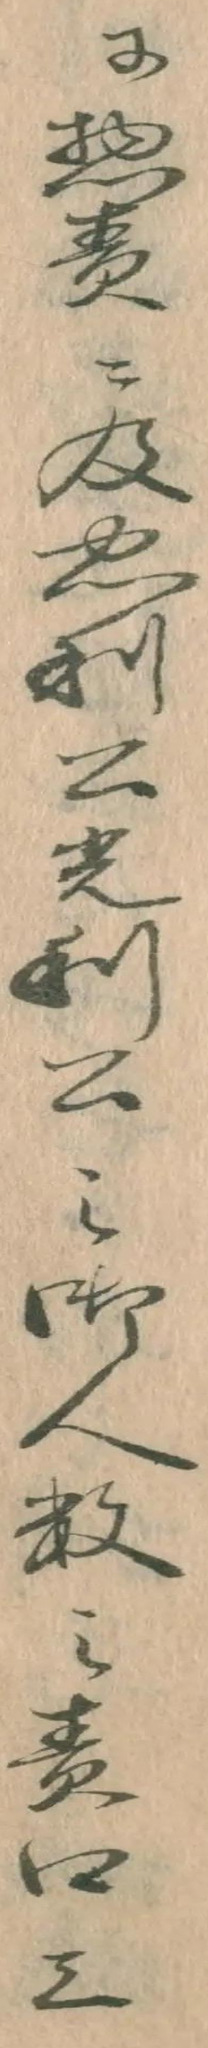尓惣責に及忠利公光利公之御人数之責口三
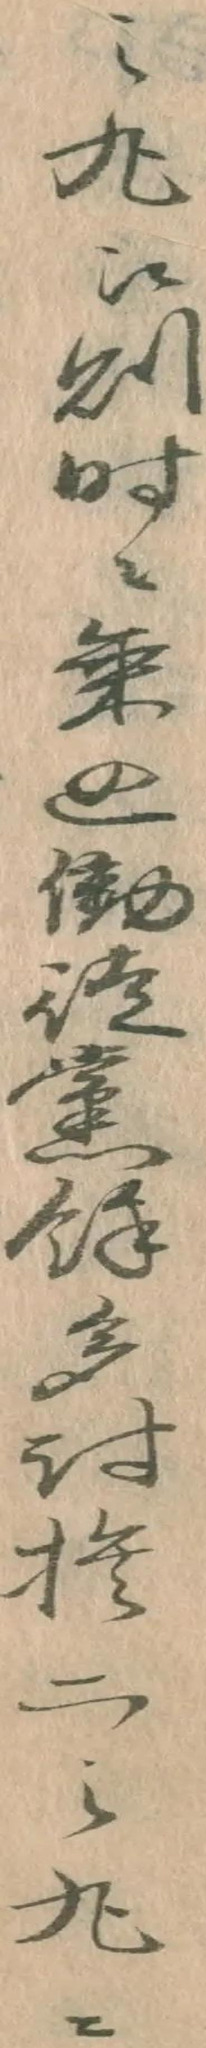之丸江則時に乗込働徒党余多討捨二之丸に
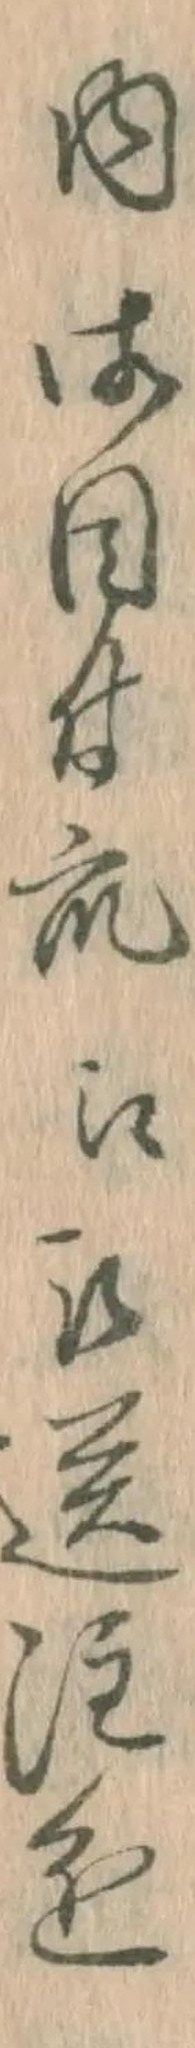内御目付衆江被送注進
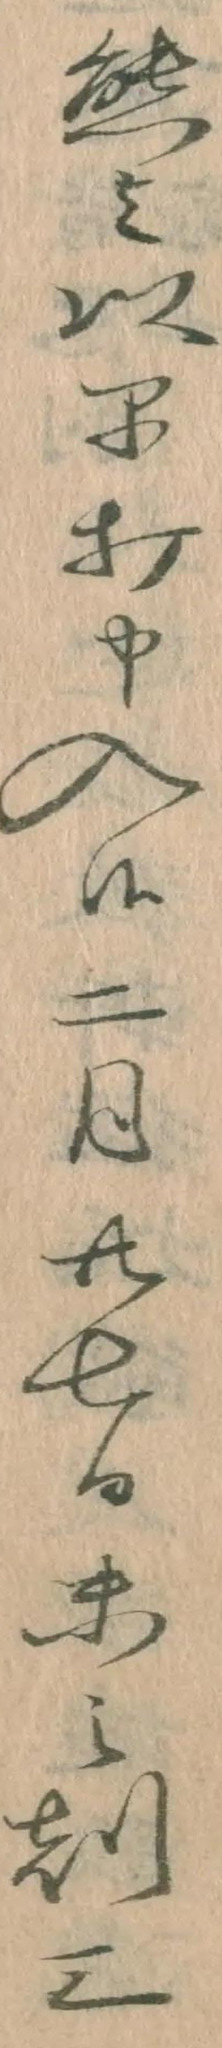熊与以早打申入候二月廿七日未之刻三
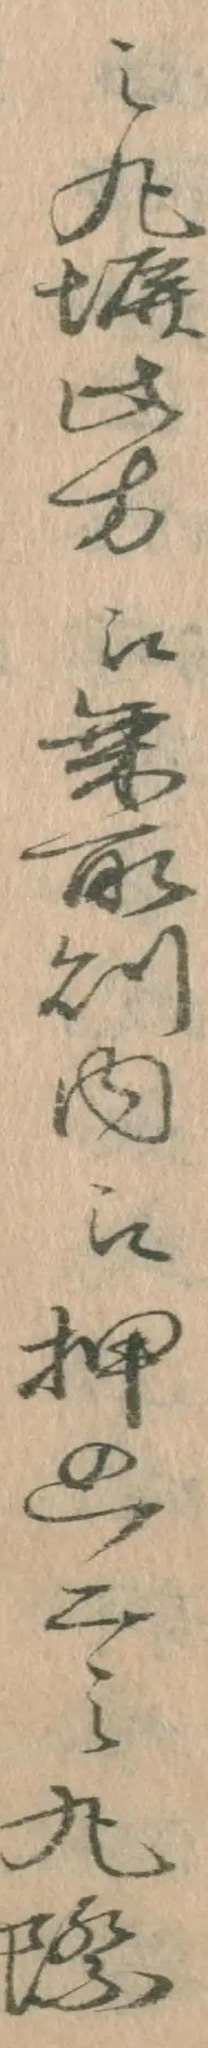之丸塀此方江乗取則内江押込二之丸際
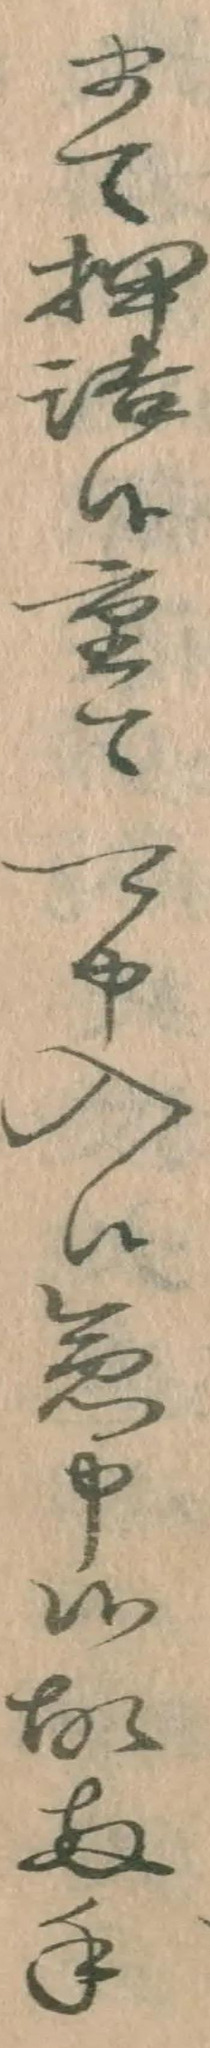まて押詰候重て可申入候急申候故両手
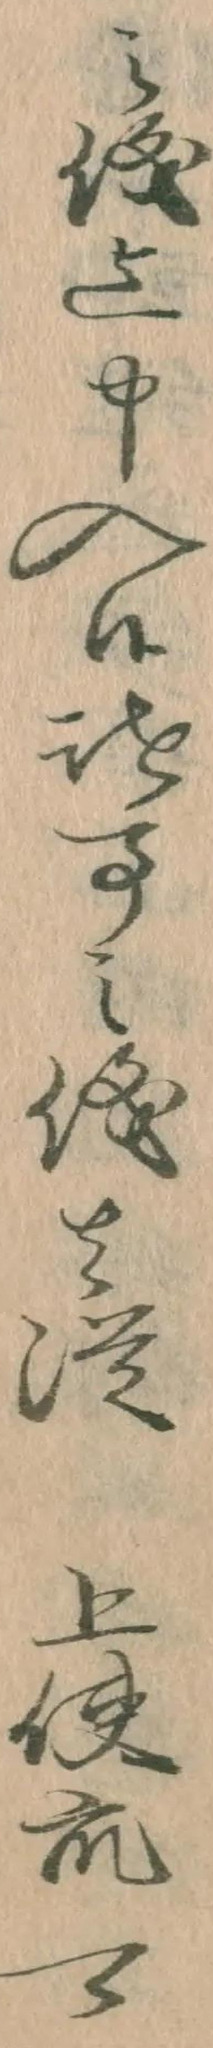之儀迄申入候諸事之儀者従上使衆可
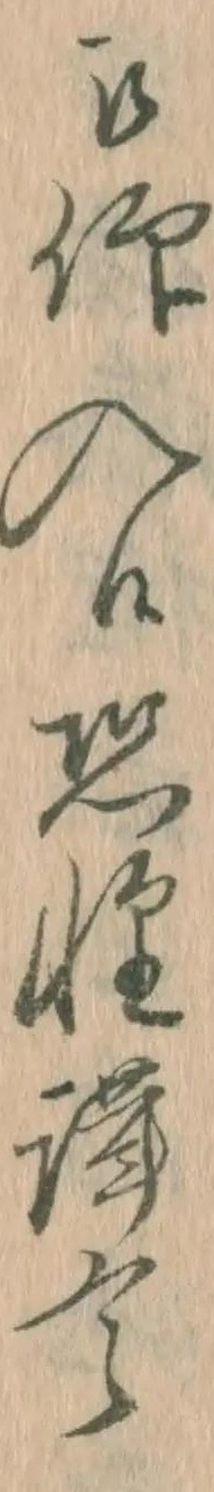被仰入候恐惶謹言
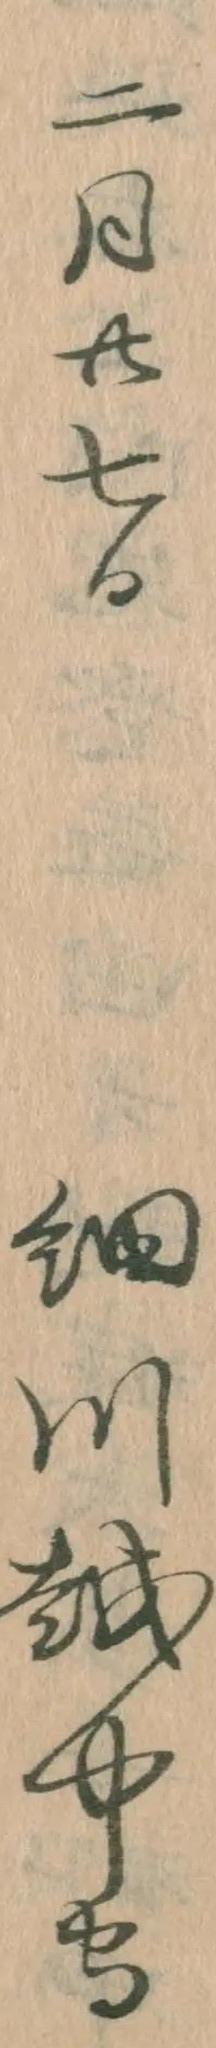二月廿七日細川越中守
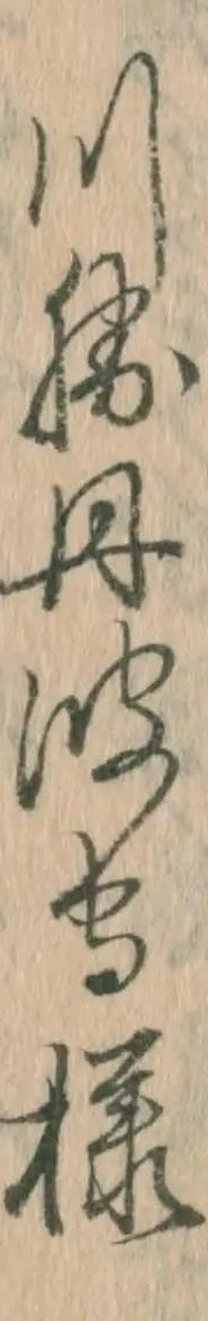川勝丹波守様
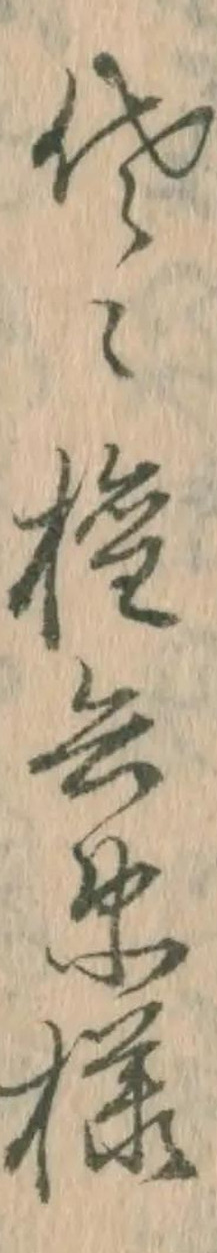佐々権兵衛様
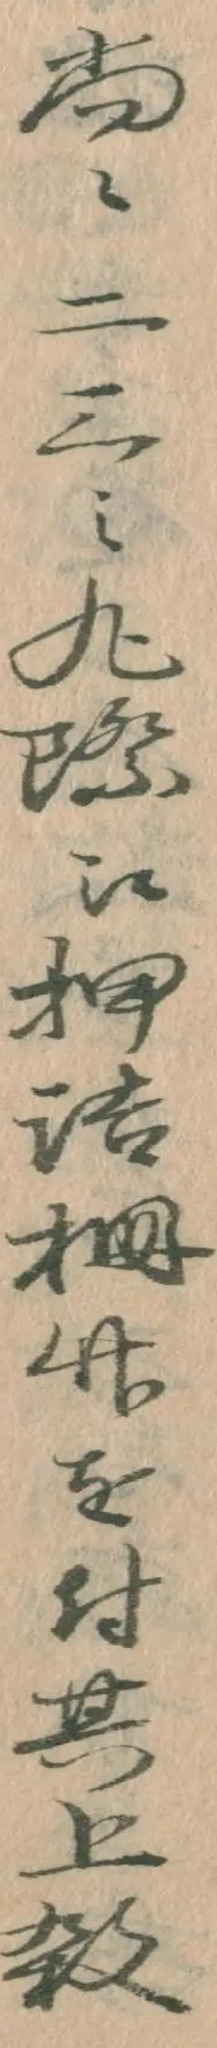尚々二三之丸際江押詰柵竹を付其上殺
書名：切支丹御退治記 49巻. [8]
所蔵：国立国会図書館 National Diet Library, JAPAN
